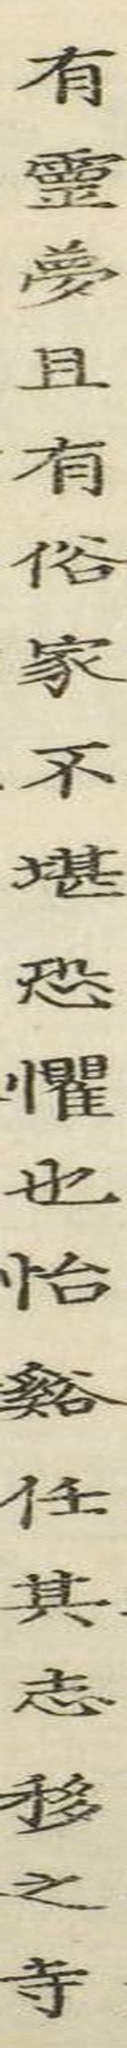有靈夢且有俗家不堪恐懼也怡谿任其志移之寺
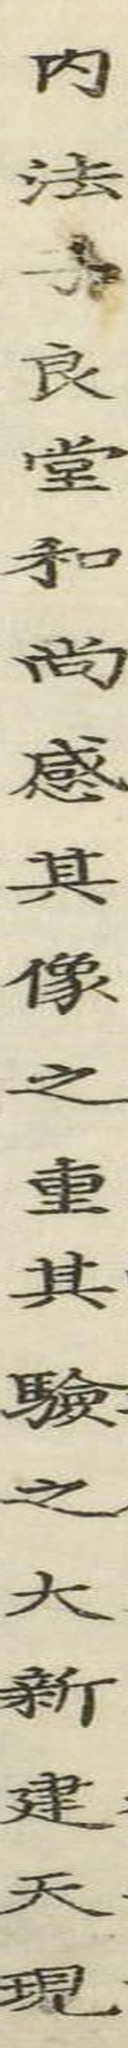内法子良堂和尚感其像之重其驗之大新建天現
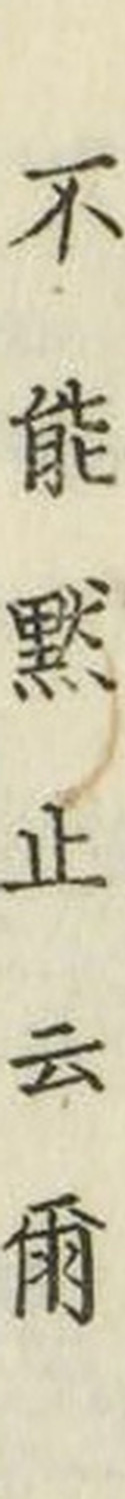不能黙止云爾
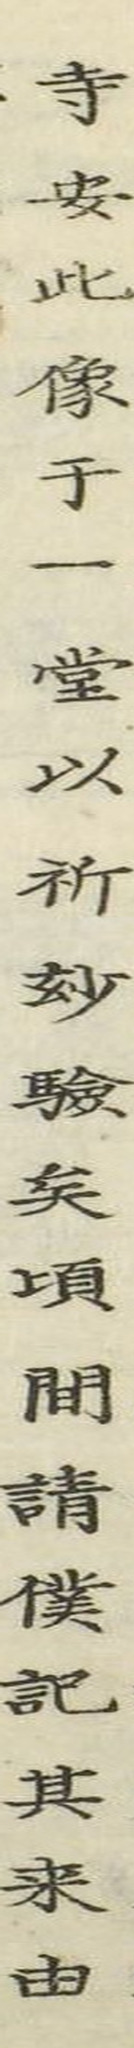寺安此像于一堂以祈玅驗矣頃間請僕記其来由
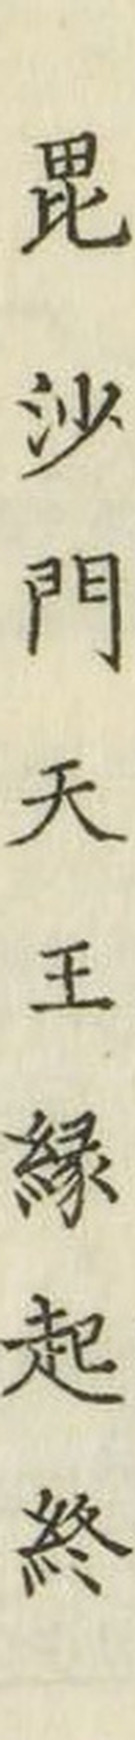毘沙門天王縁起終
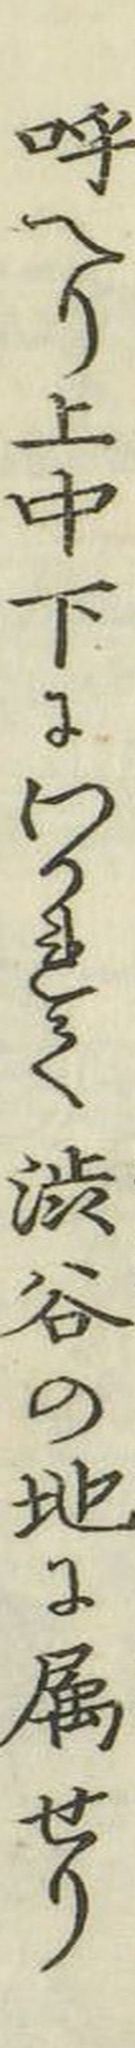呼へり上中下にわかれて渋谷の地に属せり
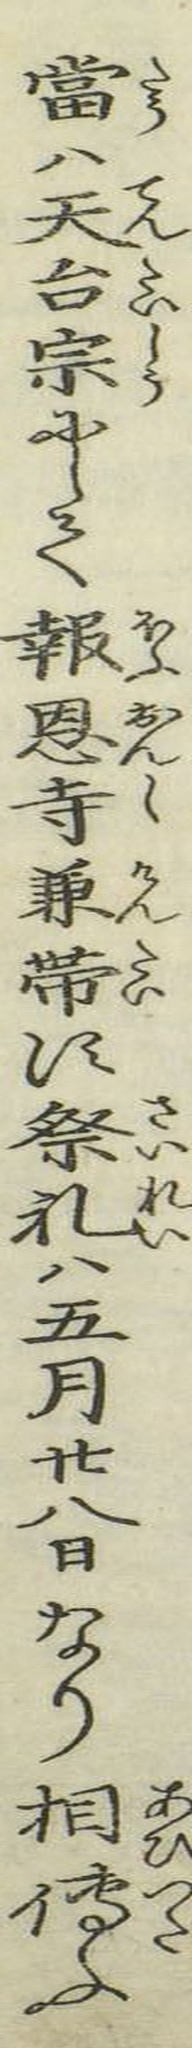當は天台宗にして報恩寺兼帯す祭礼は五月廿八日なり相傳ふ
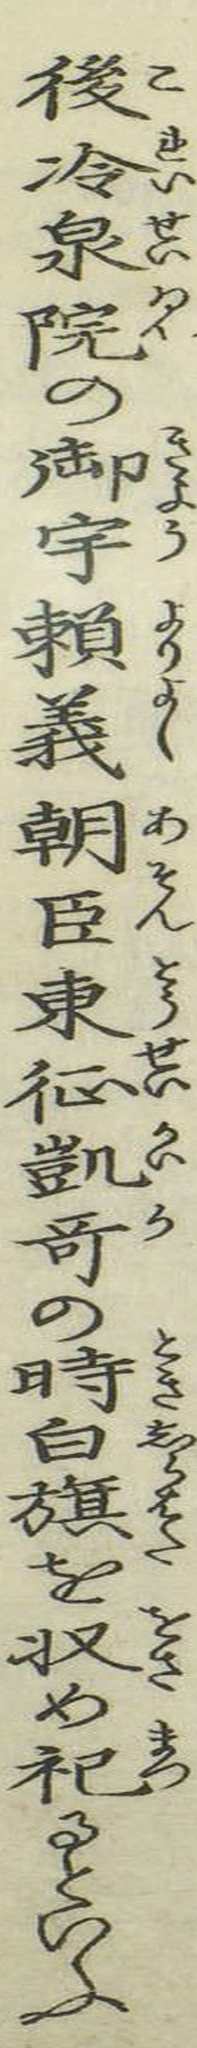後冷泉院の御宇頼義朝臣東征凱哥の時白旗を収め祀るといふ

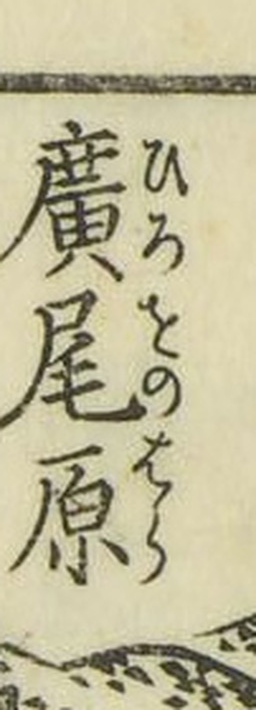廣尾原

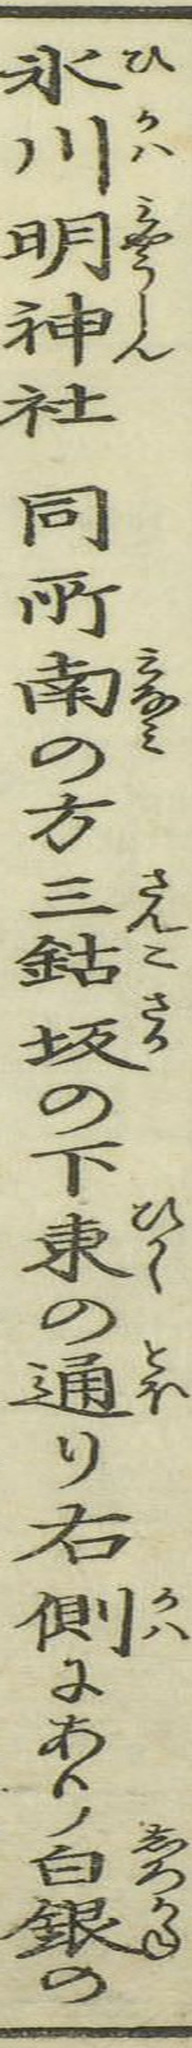氷川明神社同所南の方三鈷坂の下東の通り右側にあり白銀の
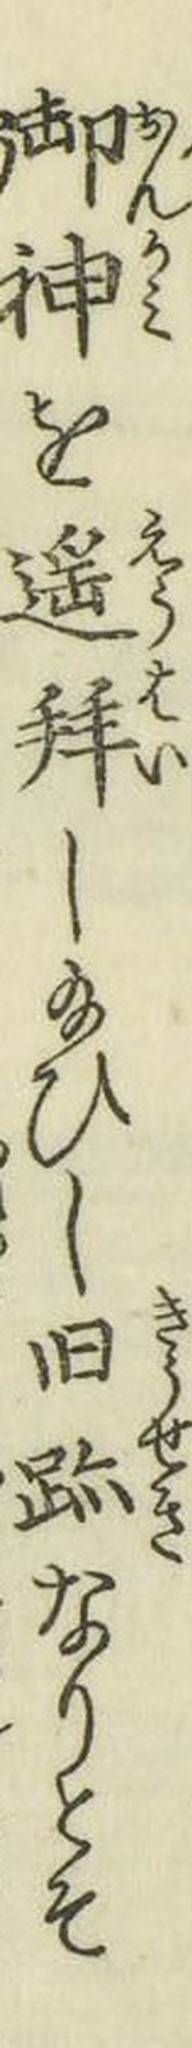御神を遥拜し給ひし旧跡なりとそ
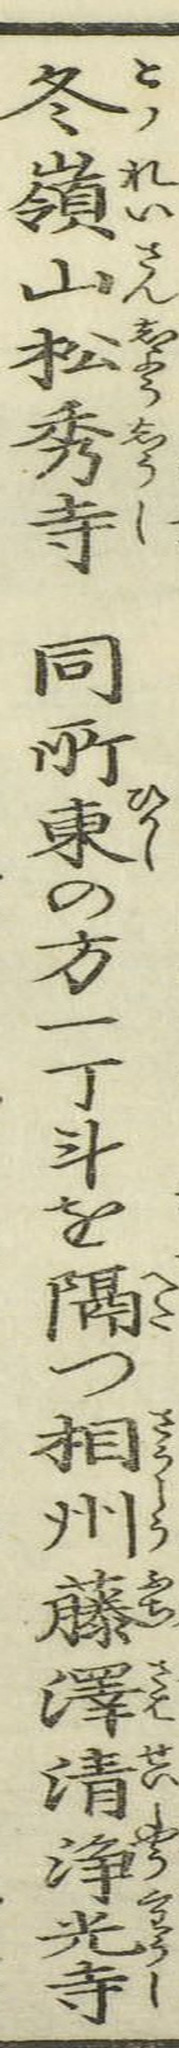冬嶺山松秀寺同所東の方一丁斗を隔つ相州藤澤清浄光寺
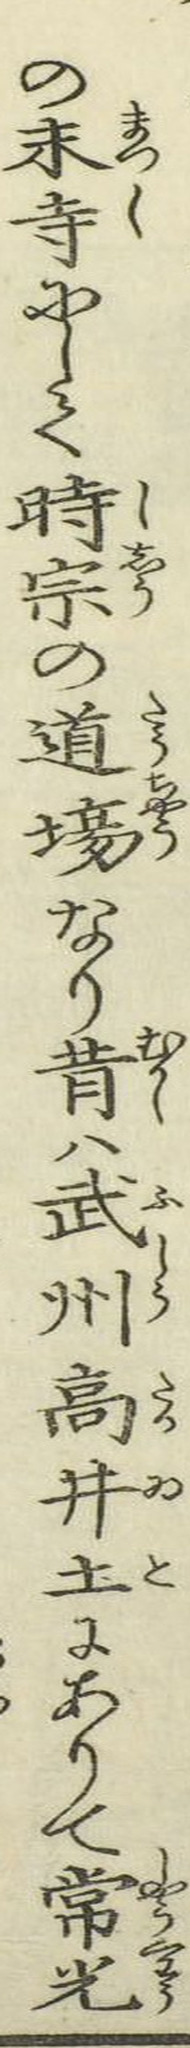の末寺にして時宗の道塲なり昔は武州高井土にありて常光
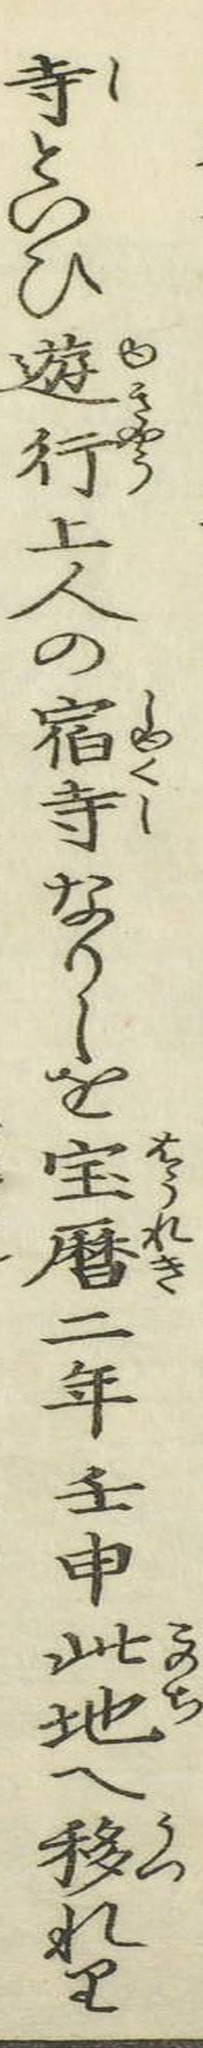寺といひ遊行上人の宿寺なりしを宝暦二年壬申此地へ移れり
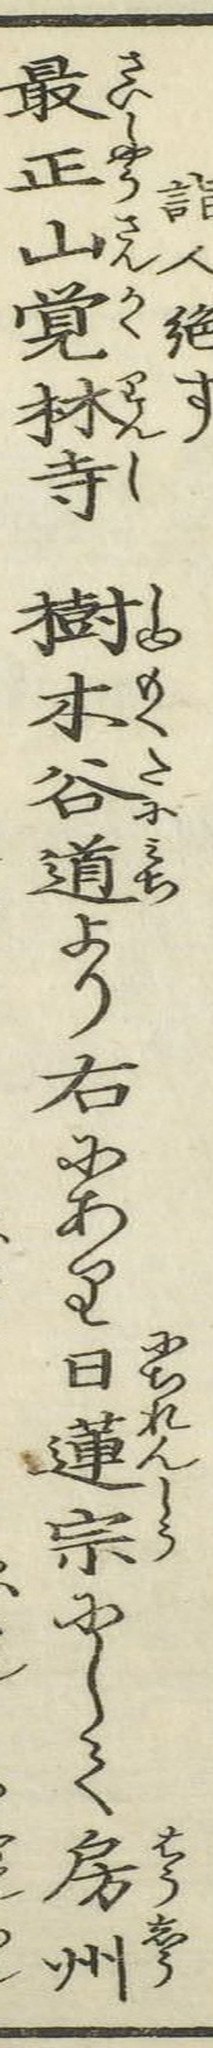最正山覚林寺樹木谷道より右にあり日蓮宗にして房州
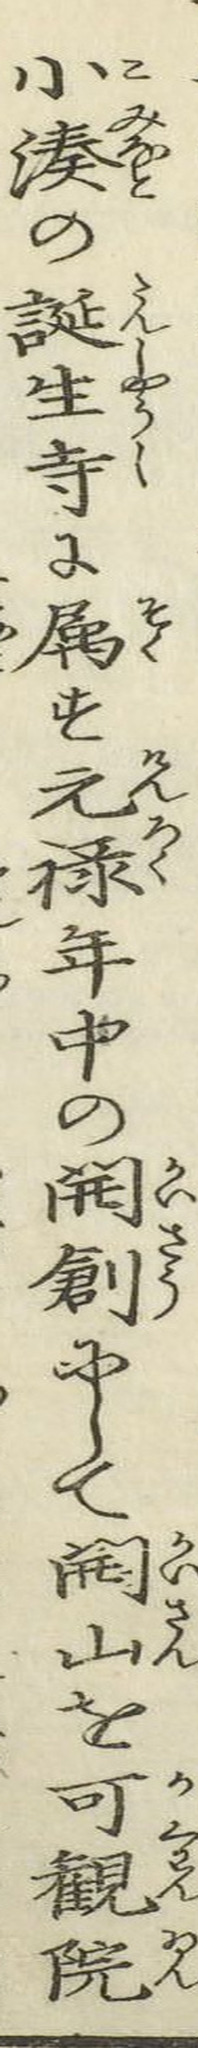小湊の誕生寺に属す元禄年中の開創にして開山を可観院
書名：江戸名所図会 20巻 巻之7
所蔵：東京学芸大学教育コンテンツアーカイブ
